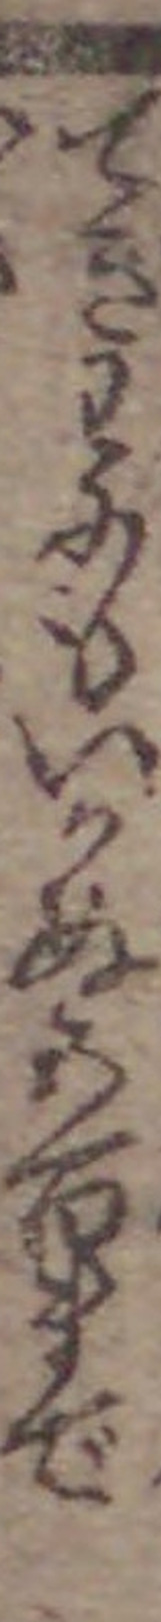てぎわにもいかぬ五百まで
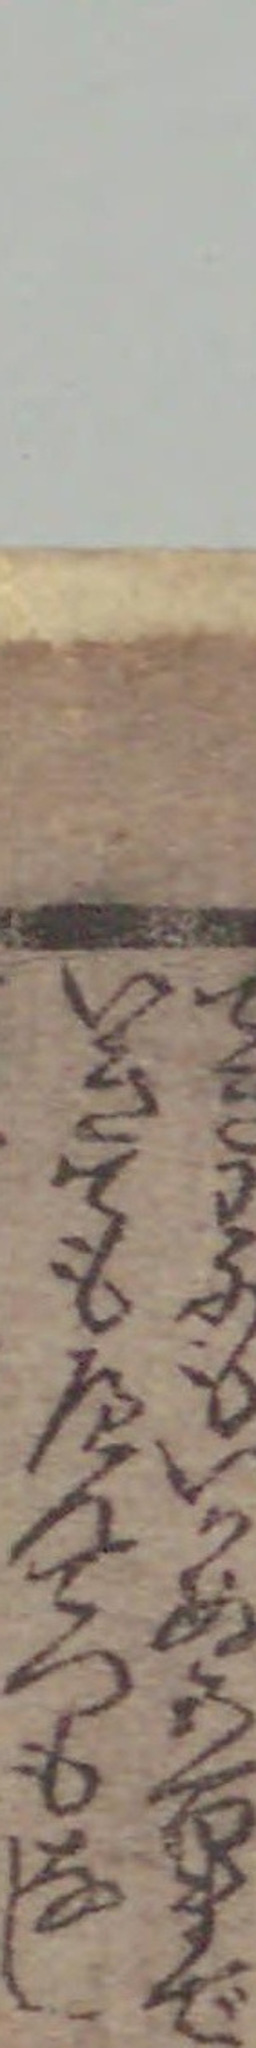いきてもへんてつもなし
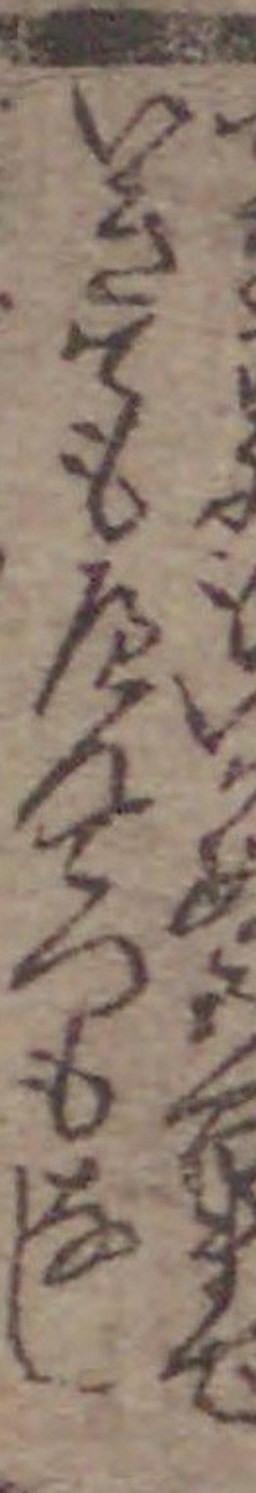いきてもへんてつもなし
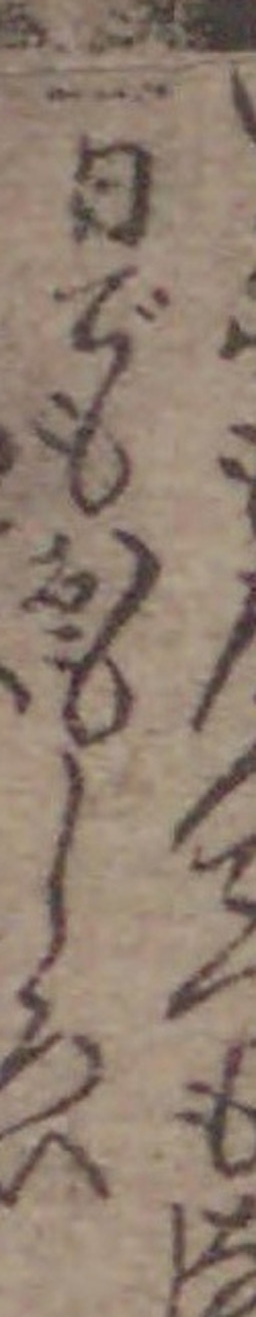一日でもおもしろい
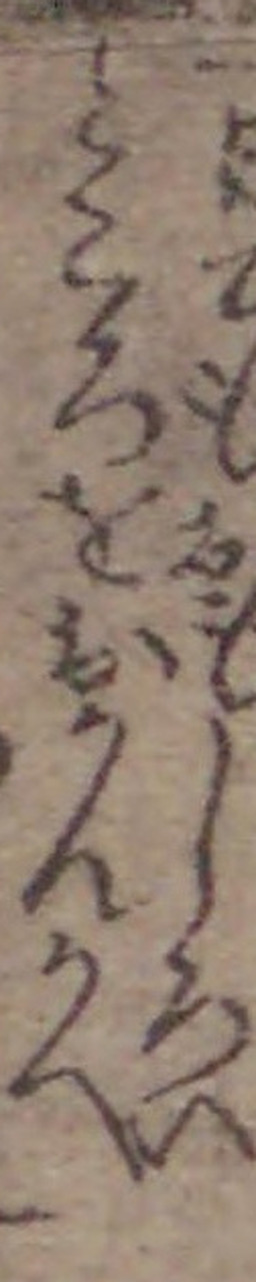ところをおかんかへ

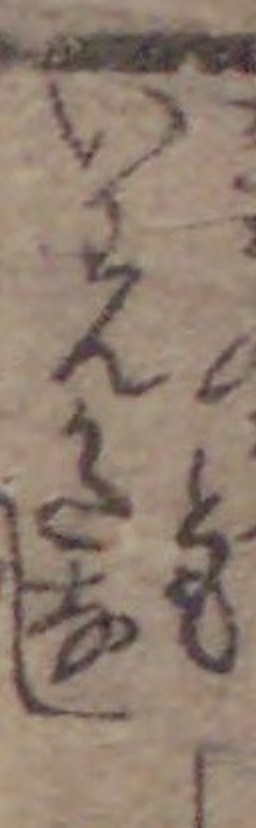いわんかたなし
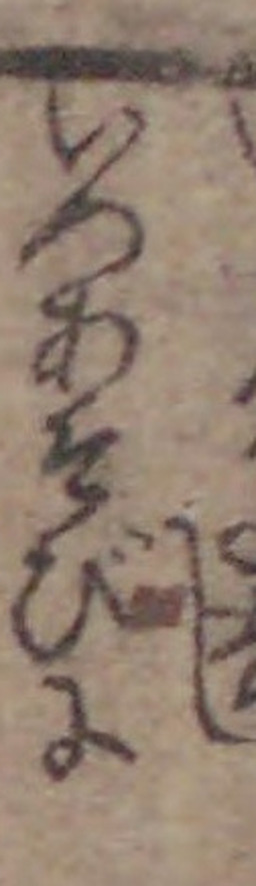いつあそびに
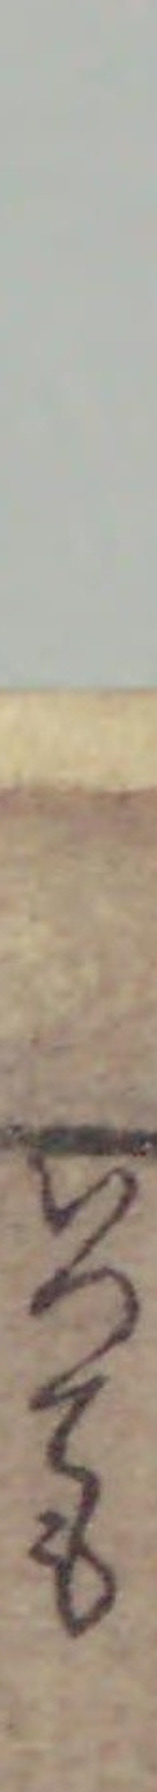いつても
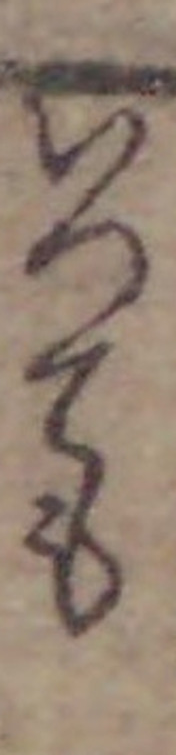いつても
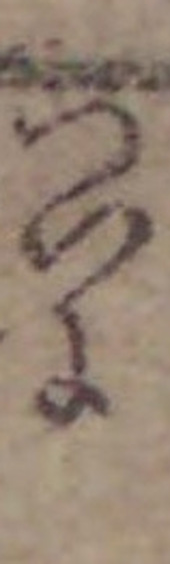ついに
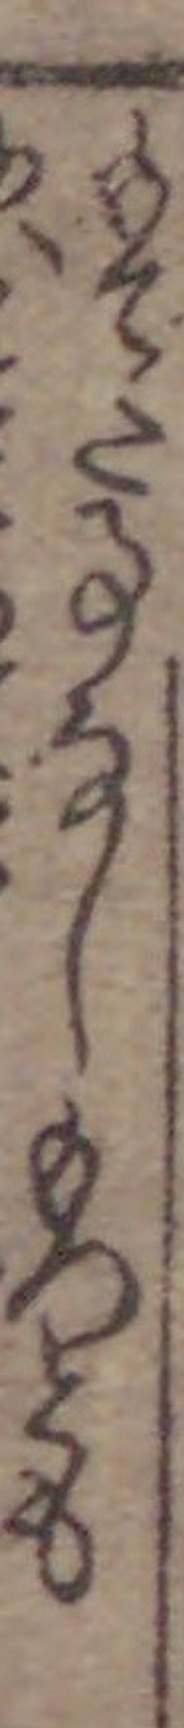もてた事なしもつとも
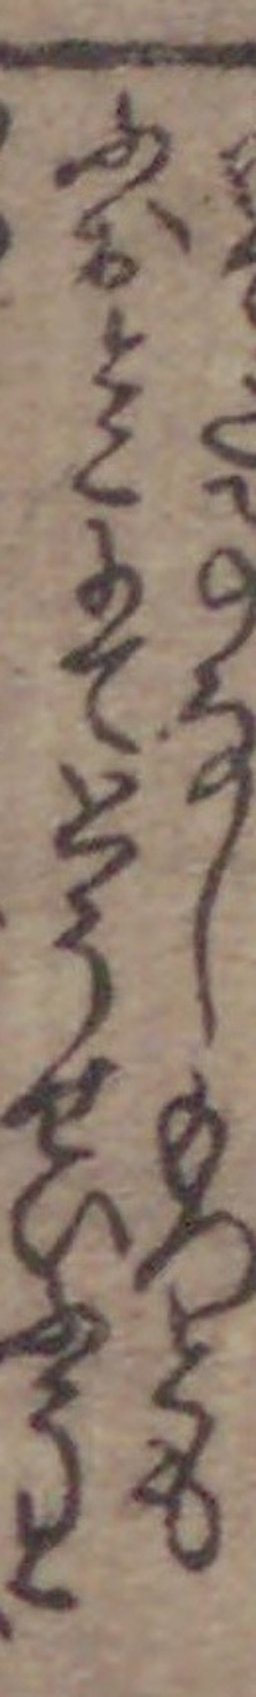ふおとこにてとうせいふうと
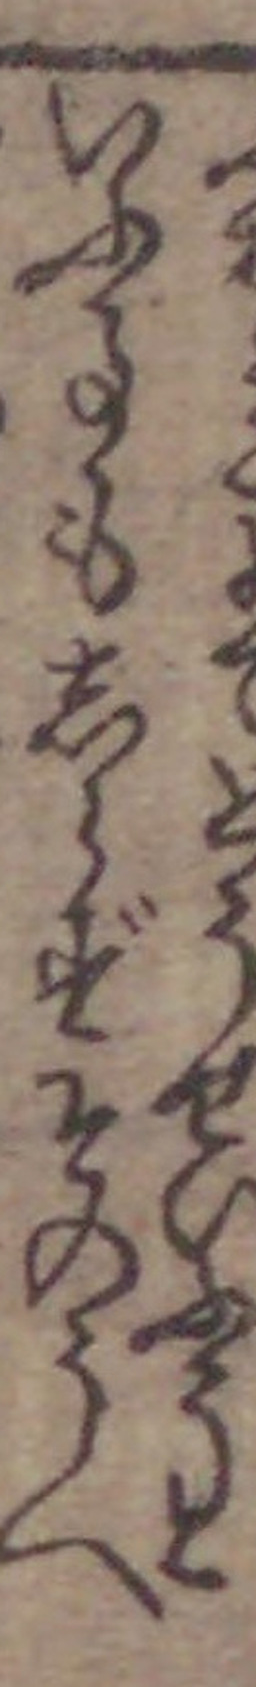いふ事もしらずそのうへ
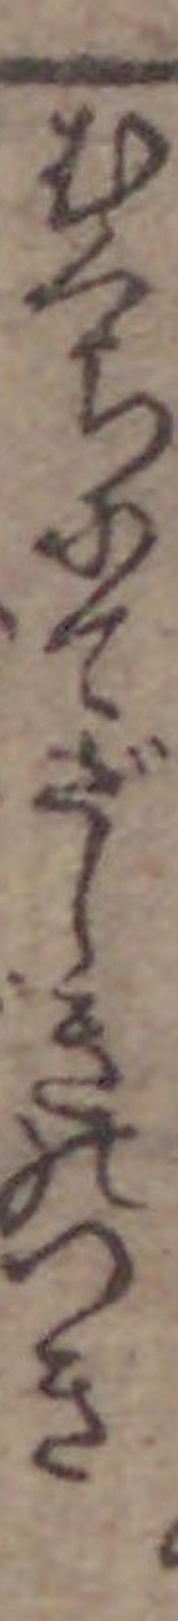むくちにてざしきのつき
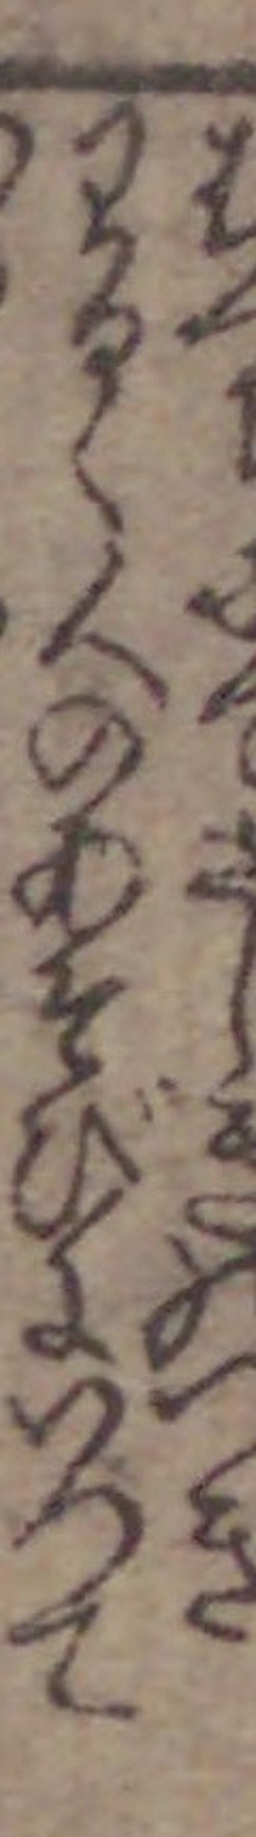わるく人のあそびにいつて
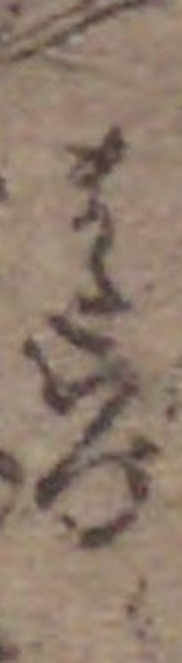またいつ
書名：御代の御寶
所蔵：国立国会図書館 National Diet Library, JAPAN
